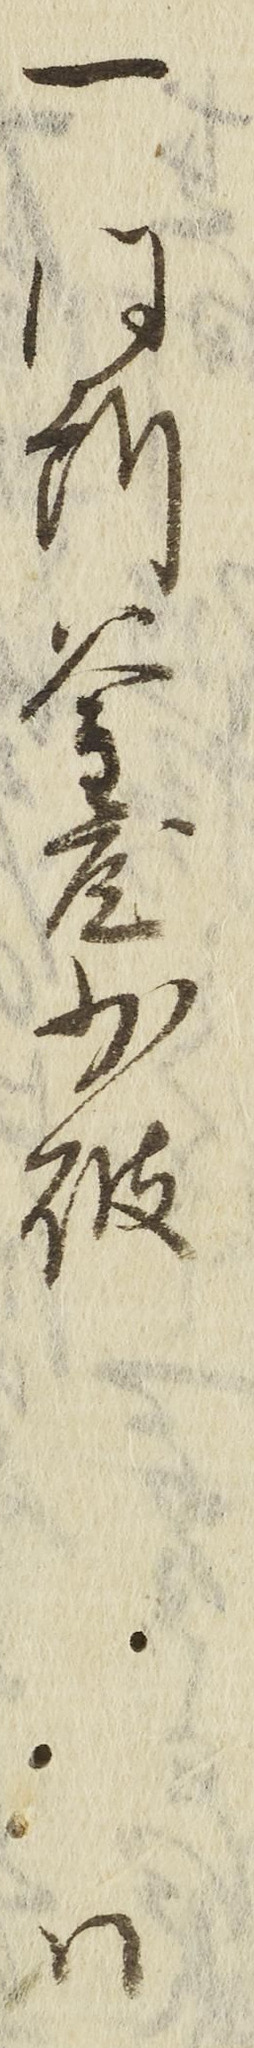一同所釜屋少破同
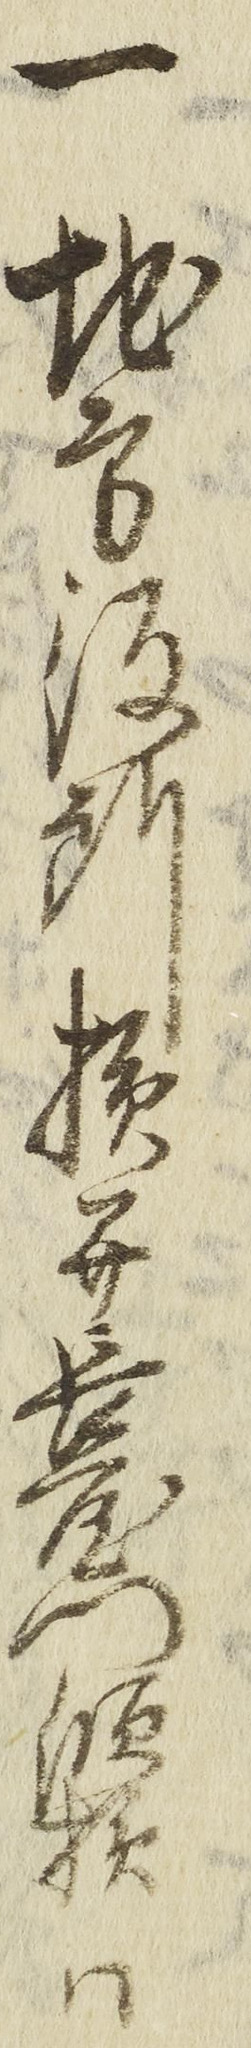一地方役所損并長屋門傾損同
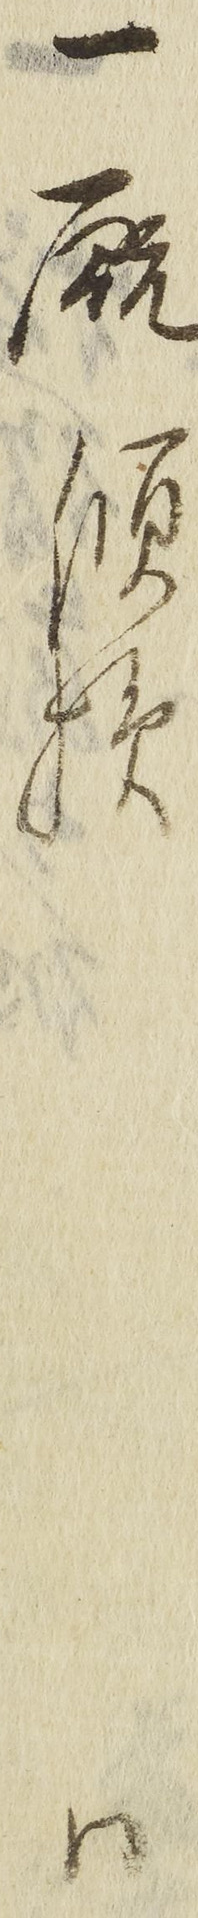一厩傾損同

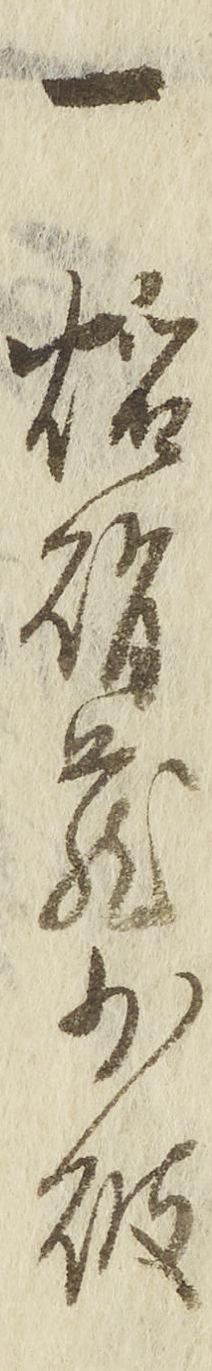一焔硝蔵少破
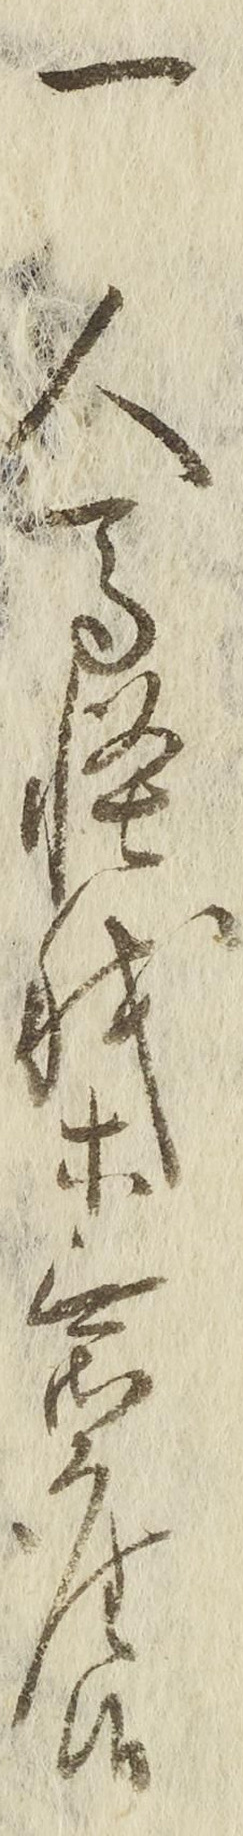一人馬怪我等無御座候
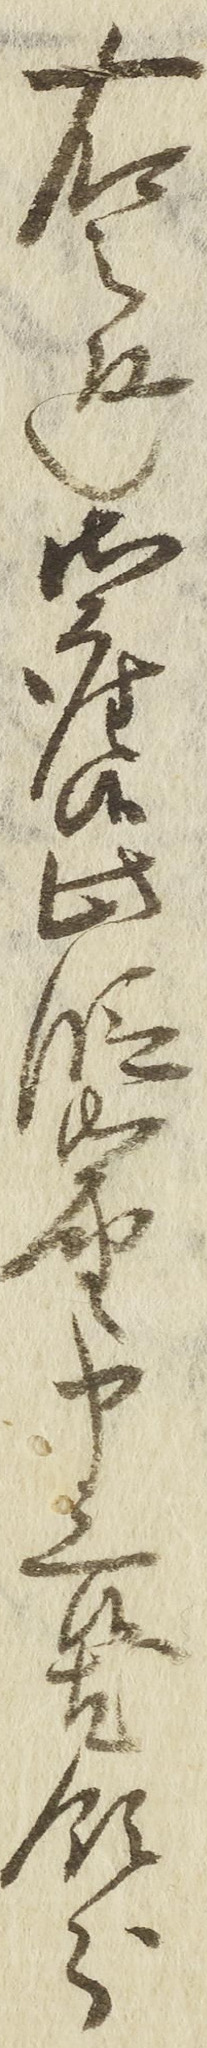右之通御座候此段御届申上候尤領分
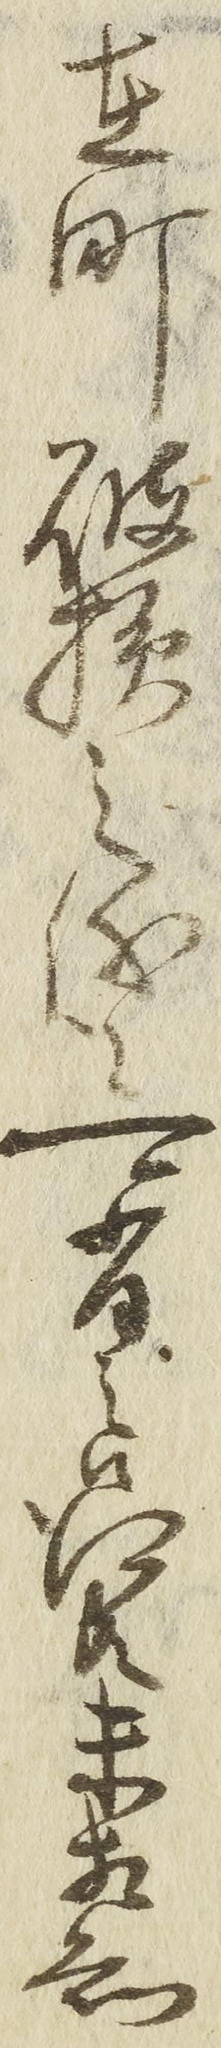在町破損之儀は可有之候得共未相知
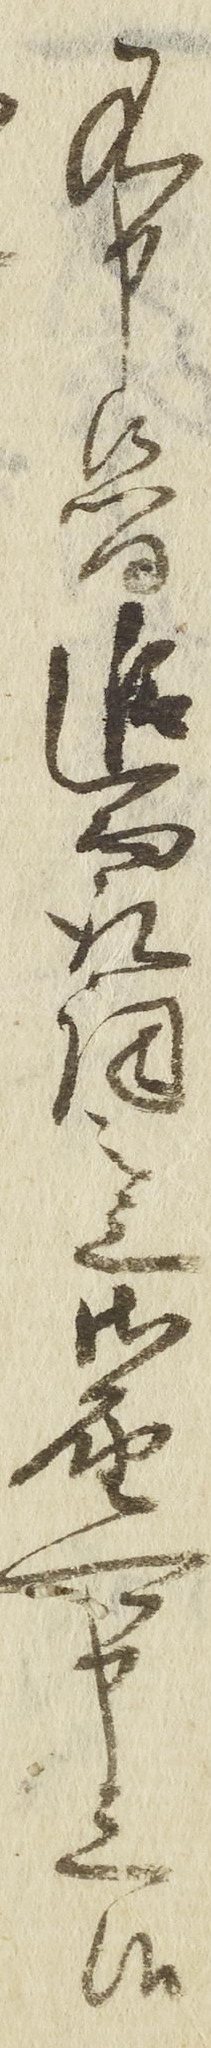不申候間追而取調之上御届可申上候
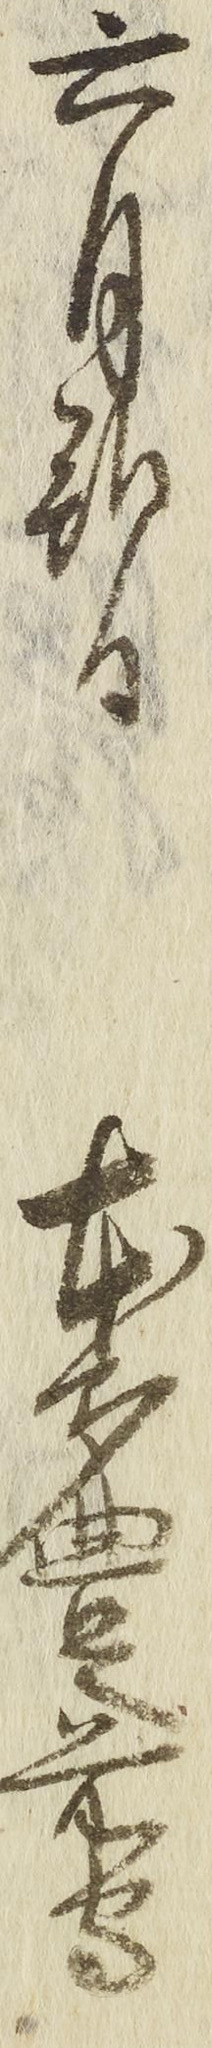六月朔日本多豊前守
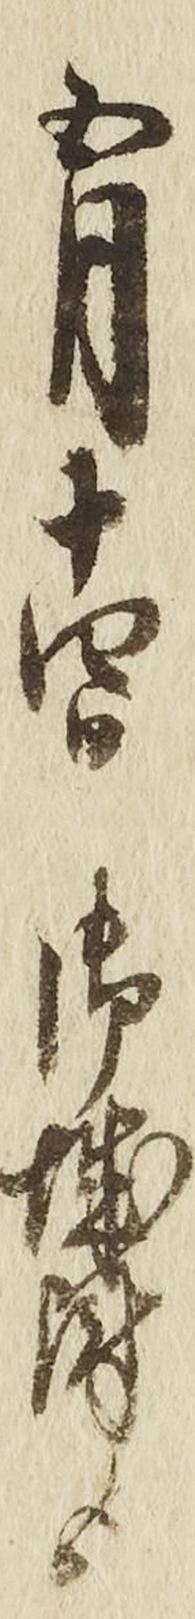五月十四日御城附ゟ
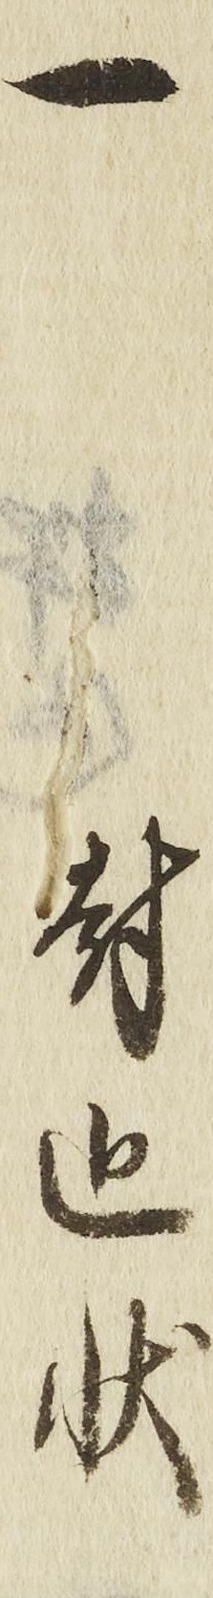一封廻状
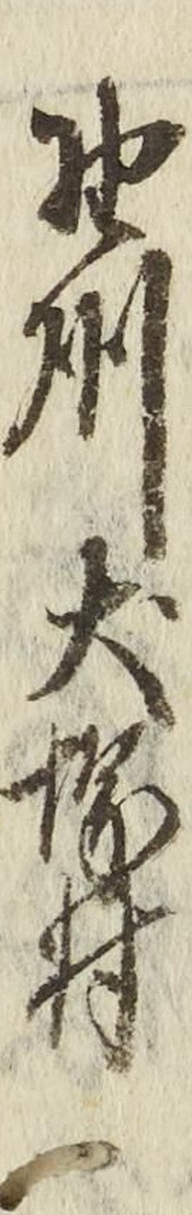野州大塚村
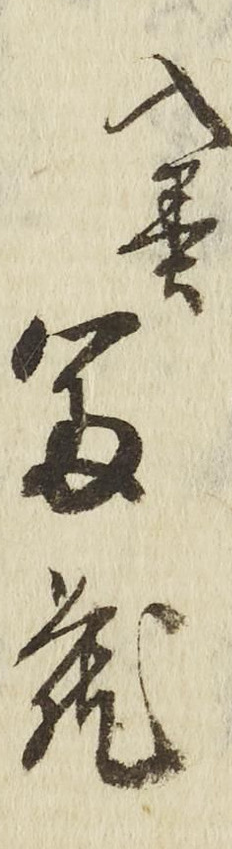入墨冨蔵
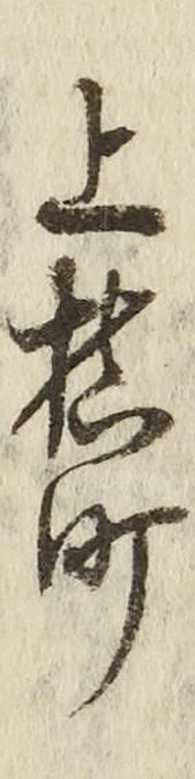上槙町
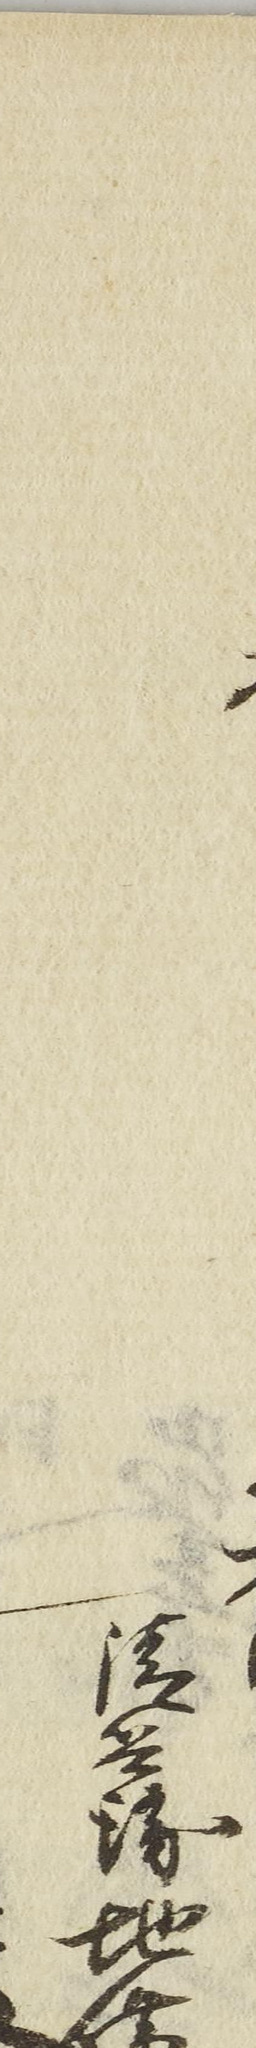清兵衛地借
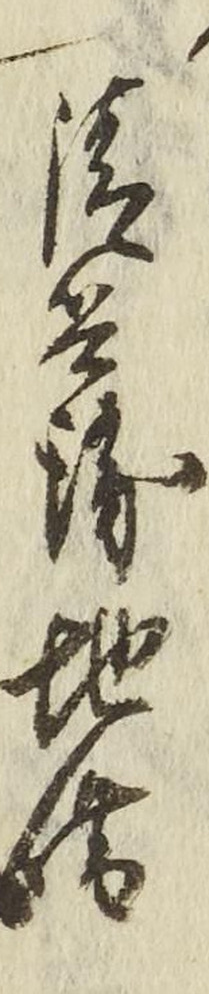清兵衛地借
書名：世説ヤンレフシ写、駿州田中城地震ニ付内外破損御届書、豫州大洲城地震ニ付内外破損御届書・封廻状
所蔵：東京大学地震研究所図書室 Earthquake Research Institute Library, The University of Tokyo, JAPAN
